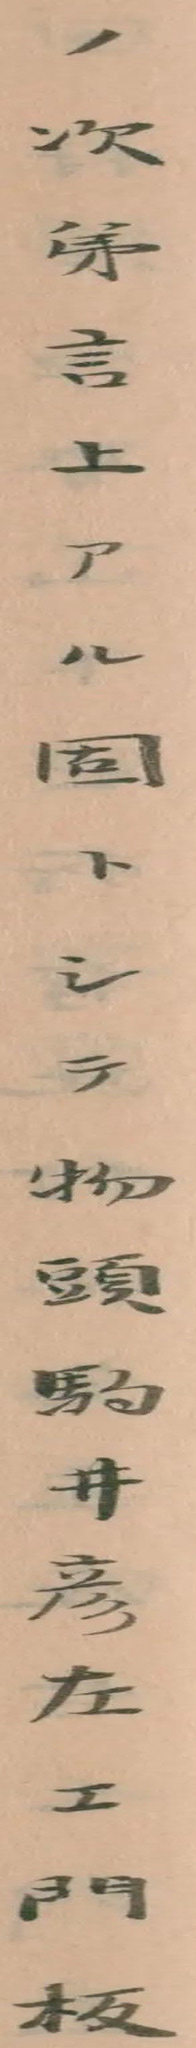ノ次第言上アル固トシテ者頭駒井彦左衛門板
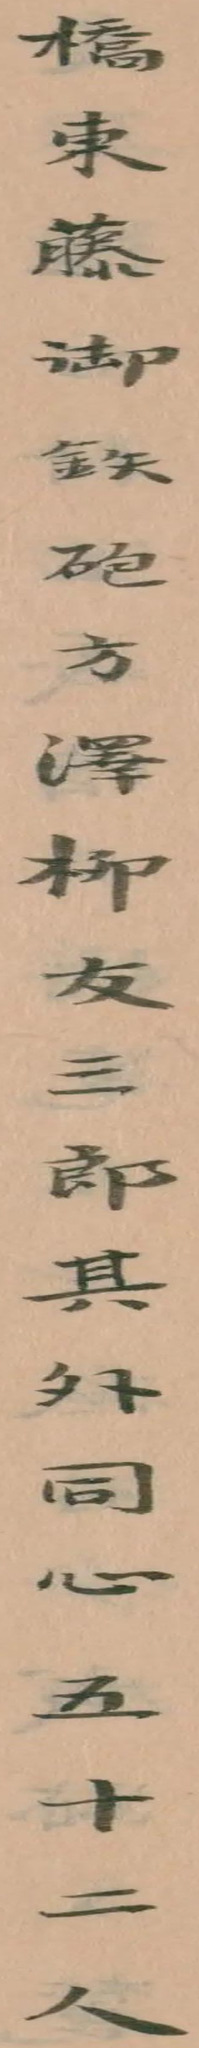橋東藤御鉄砲方沢柳友三郎其外同心五十二人
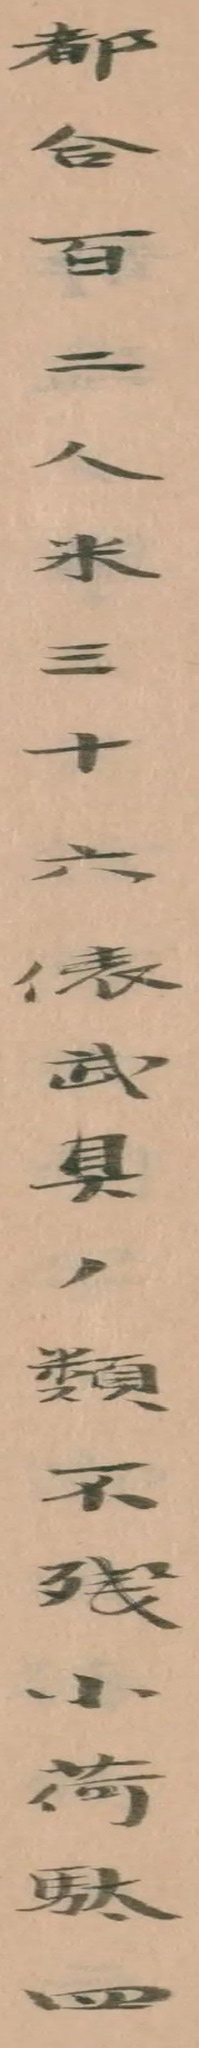都合百二人米三十六俵武具ノ類不残小荷駄四
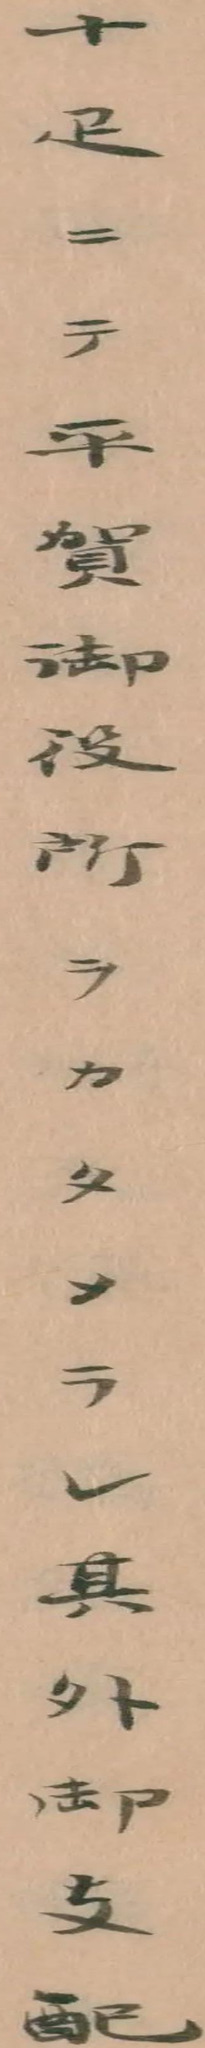十疋二テ平賀御役所ヲカタメラレ其外御支配
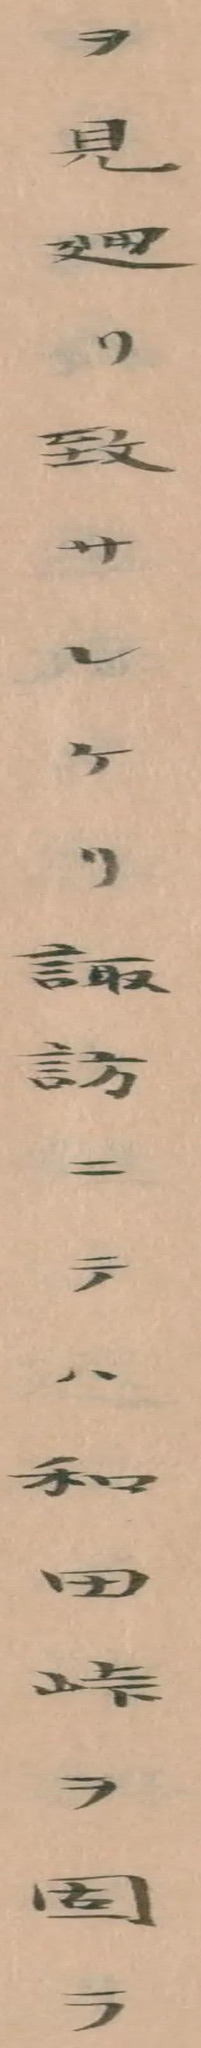ヲ見回り致サレケリ諏訪二テハ和田峠ヲ固ラ
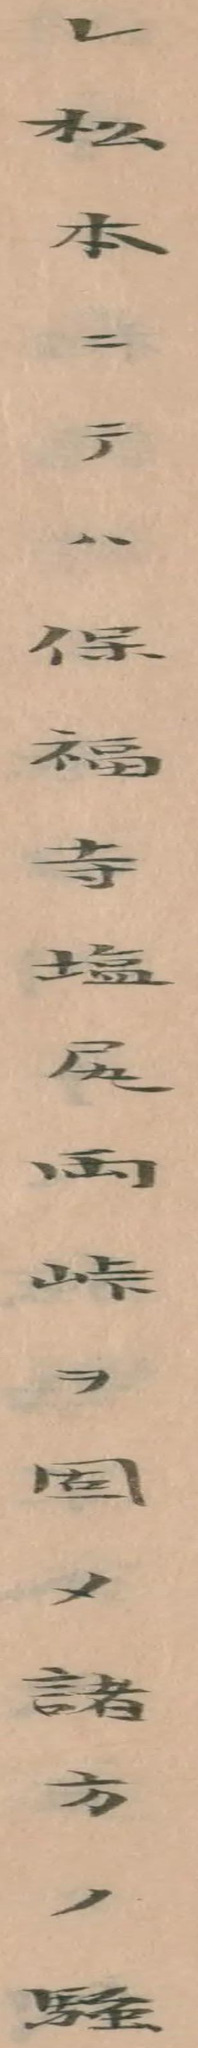レ松本二テハ保福寺塩尻両峠ヲ固メ諸方ノ騒
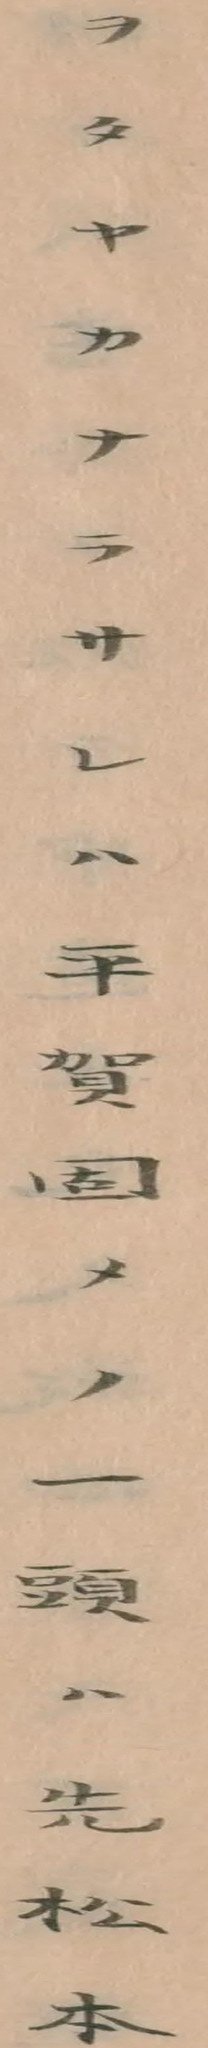ヲタヤカナラサレハ平賀固メノ一頭ハ先松本
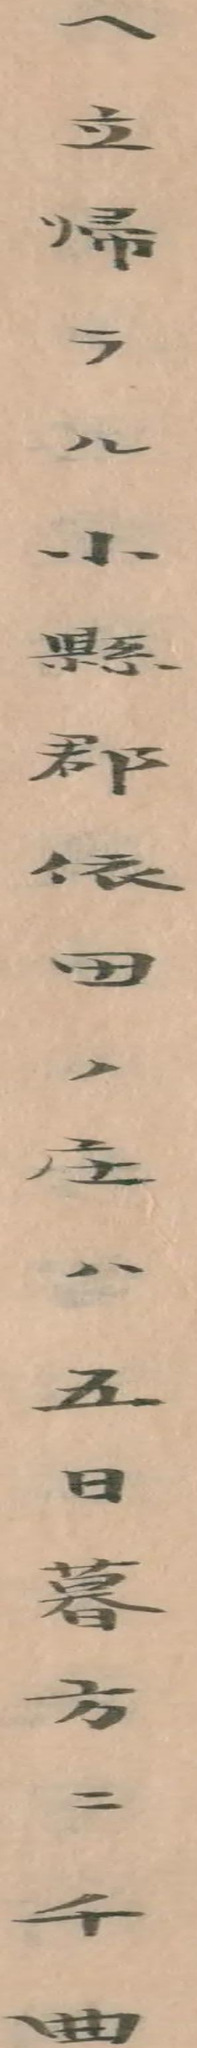へ立帰ラル小県郡依田ノ庄ハ五日暮方二千曲
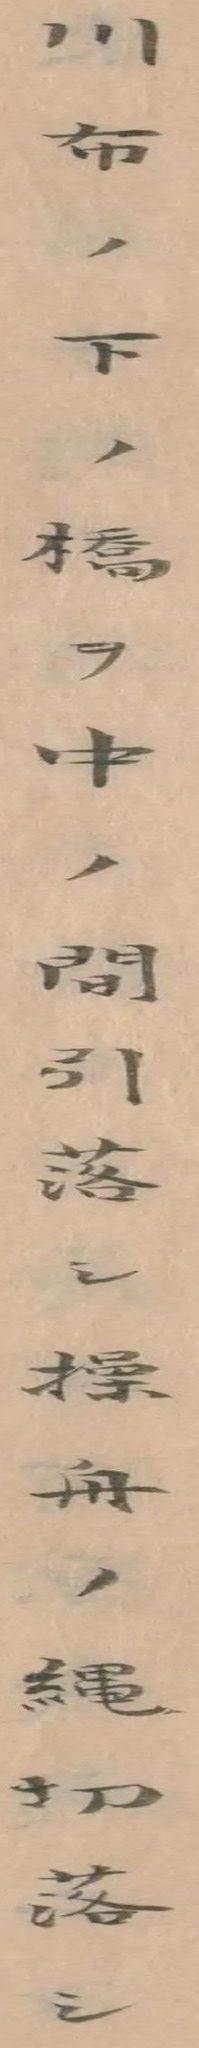川布ノ下ノ橋ヲ中ノ間引落シ繰舟ノ縄切落シ
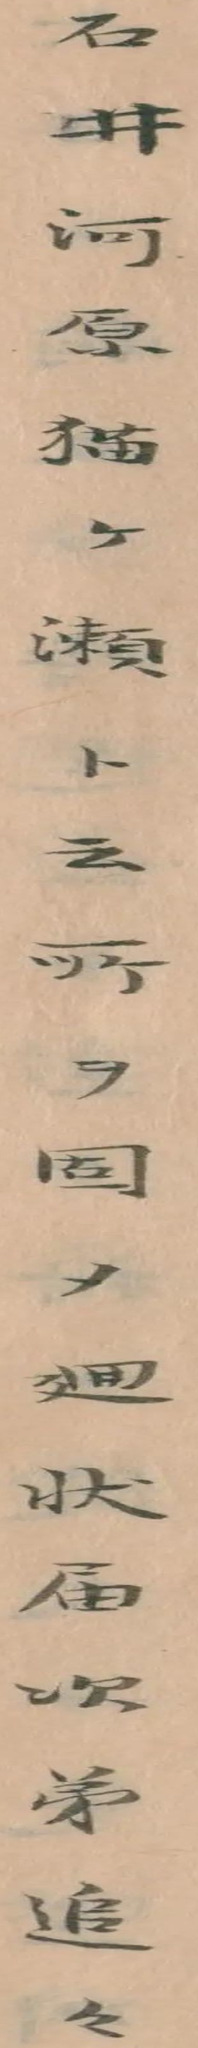石井河原猫ケ瀬ト云所ヲ固メ廻状届次第追々

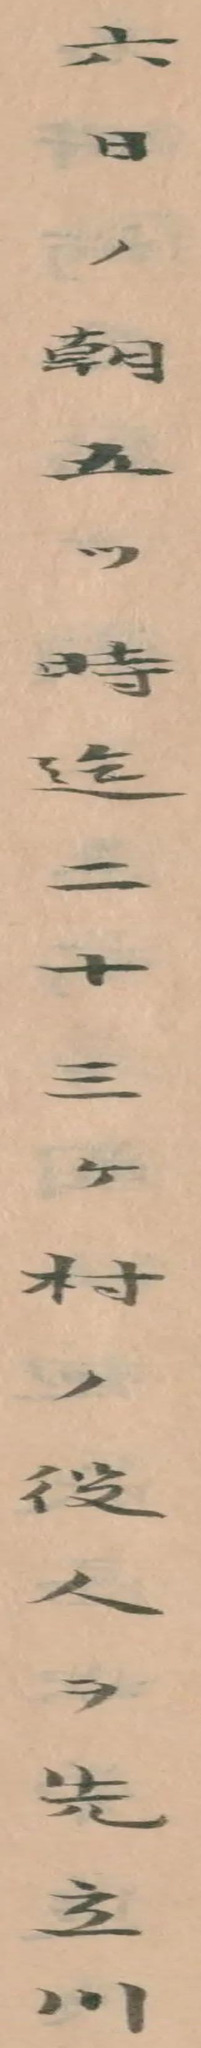六日ノ朝五ッ時迄二十三ヶ村ノ役人ヲ先立川
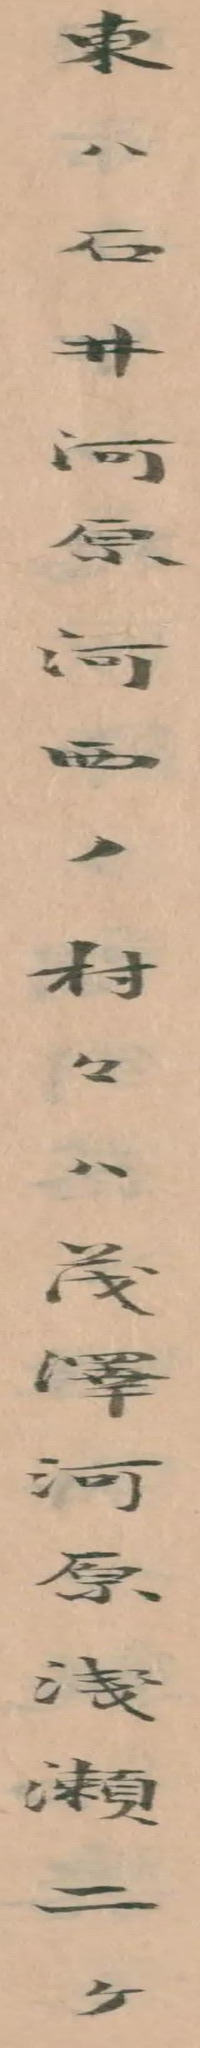東ハ石井河原河西ノ村々ハ茂沢河原浅瀬二ヶ
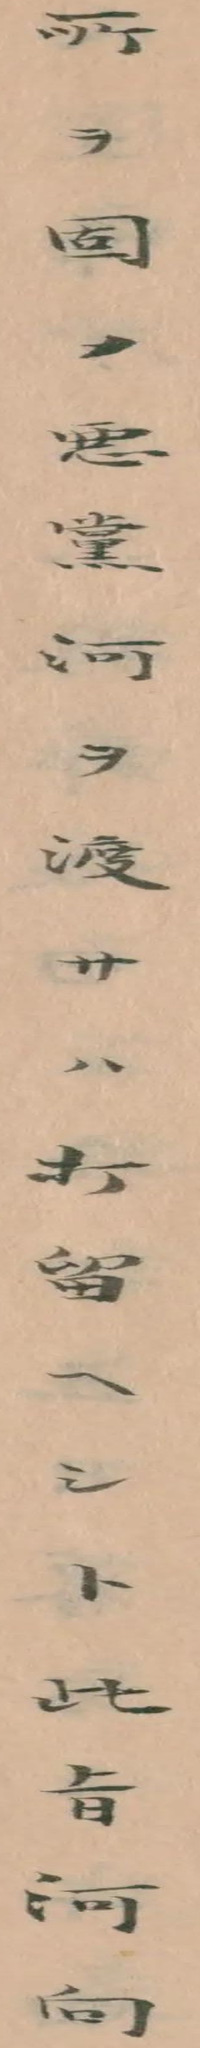所ヲ固メ悪党河ヲ渡サハ打留ヘシト此旨河向
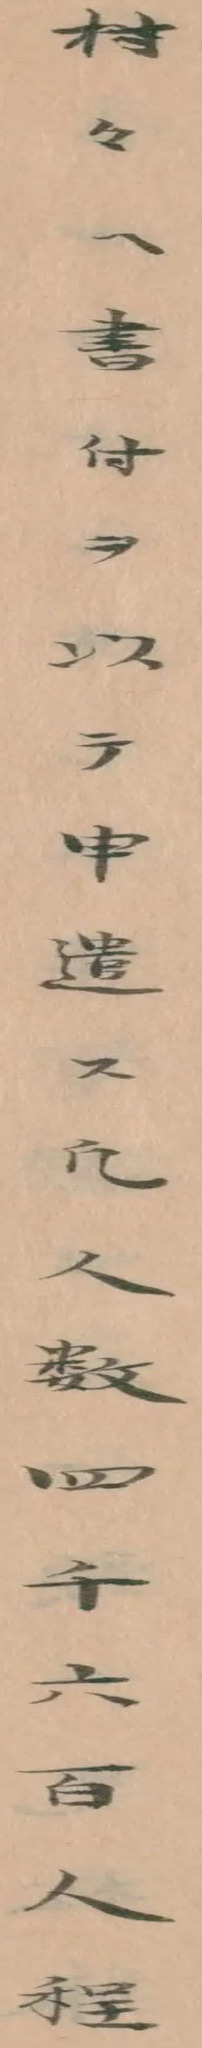村々へ書付ヲ以テ申遣ス凡人数四千六百人程
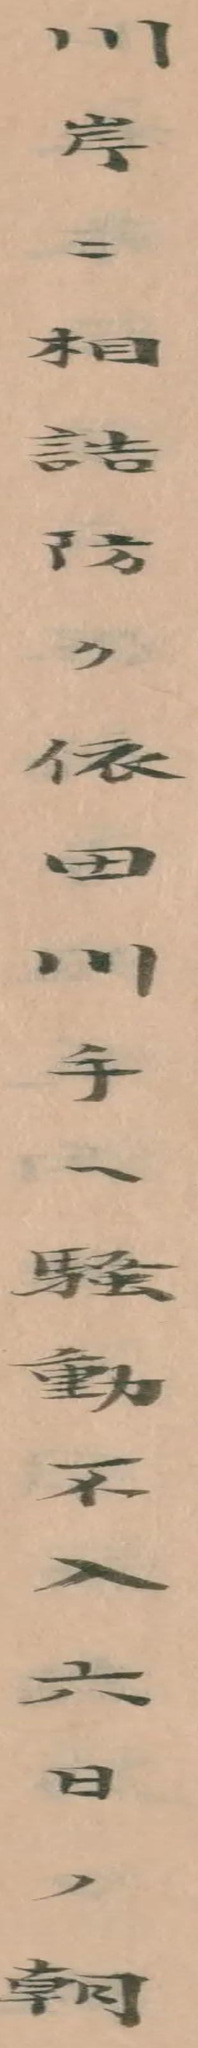川岸二相詰防ク依田川手へ騒動不入六日ノ朝
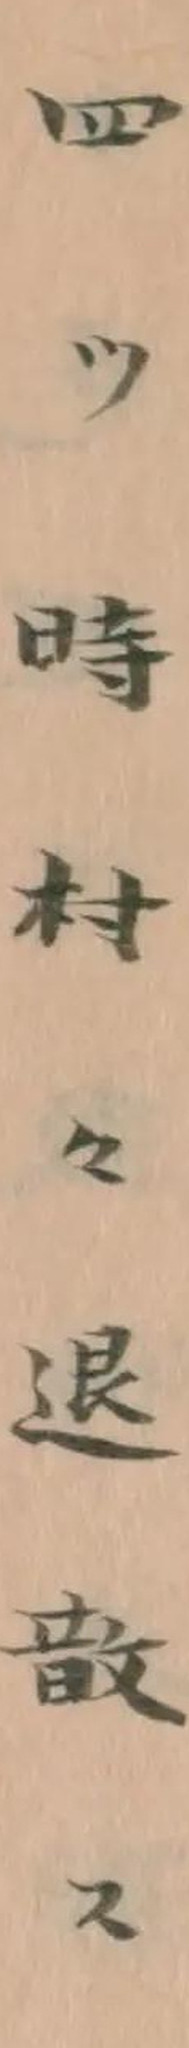四ッ時村々退散ス
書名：地災撮要. 巻3(地震之部)-巻4(噴火之部)
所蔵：国立国会図書館 National Diet Library, JAPAN
